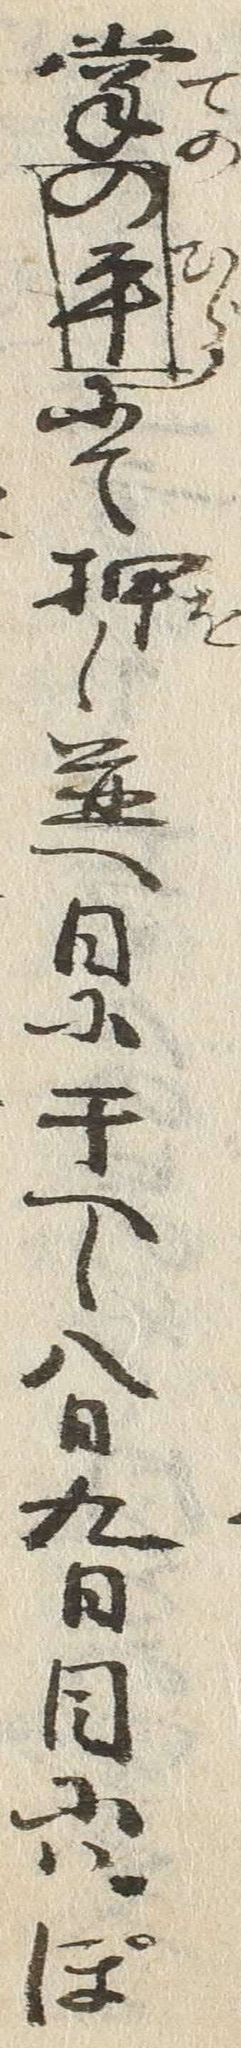掌の平尓て押し並へ日尓干へし八日九日目尓は。ぽ
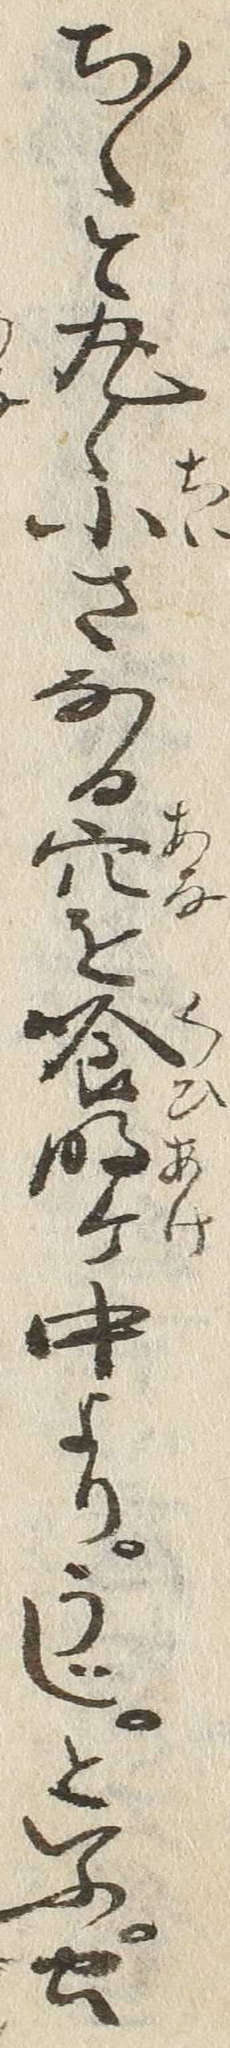ち〳〵と丸く小さなる穴を喰明け中より。うじ。といふ。虫
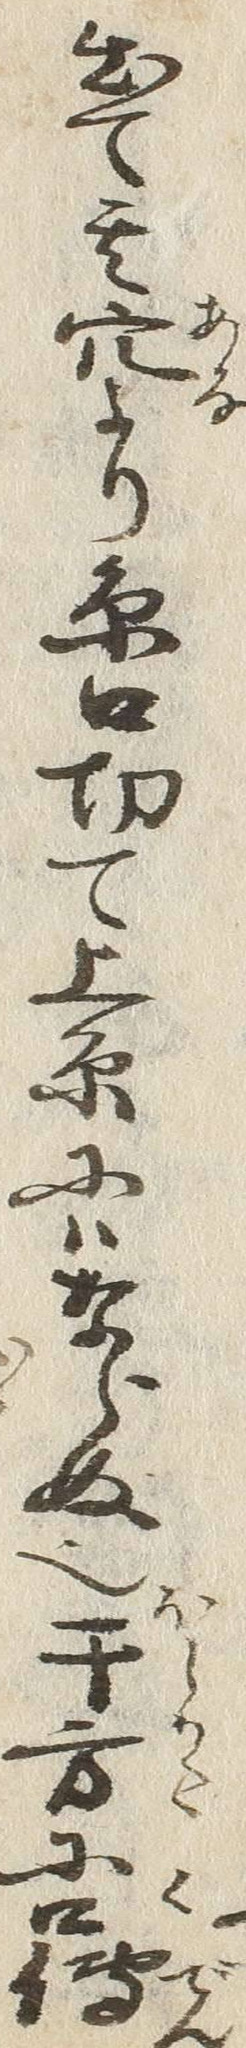出て其穴より糸口切て上糸尓はならぬ也干方尓口傳
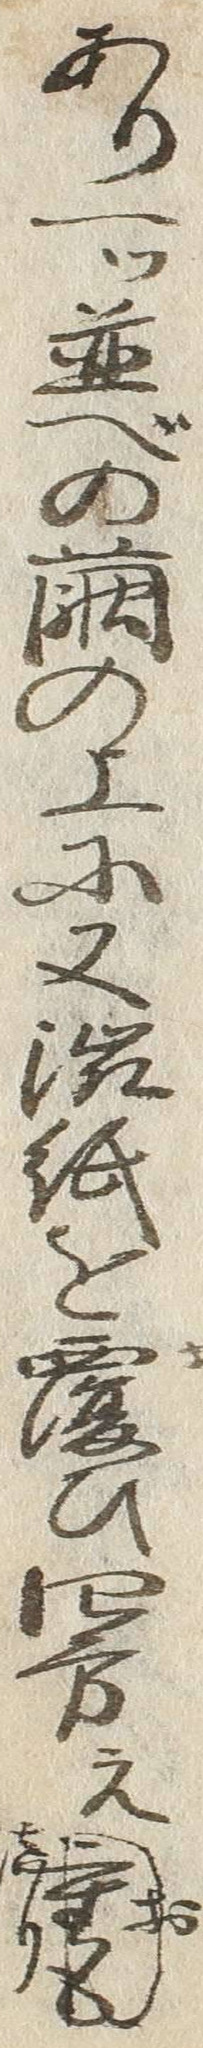あり一ツ並べの繭の上尓又渋紙を覆ひ四方え重も
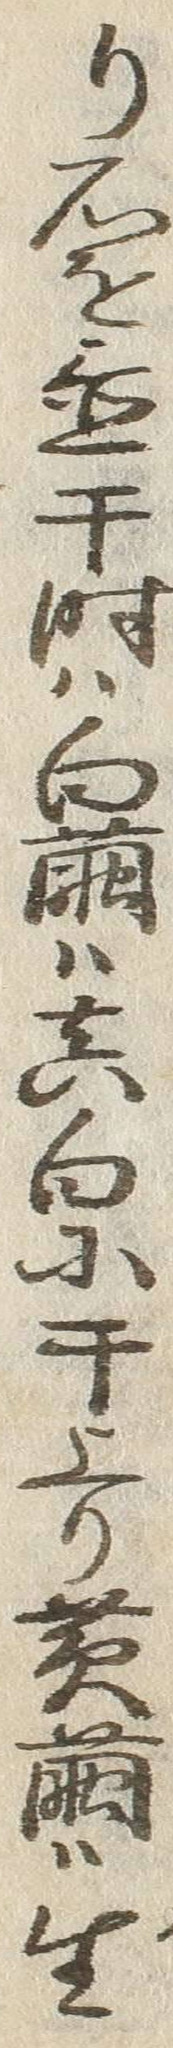り石を置干時は白繭は真白尓干上り黄繭は生
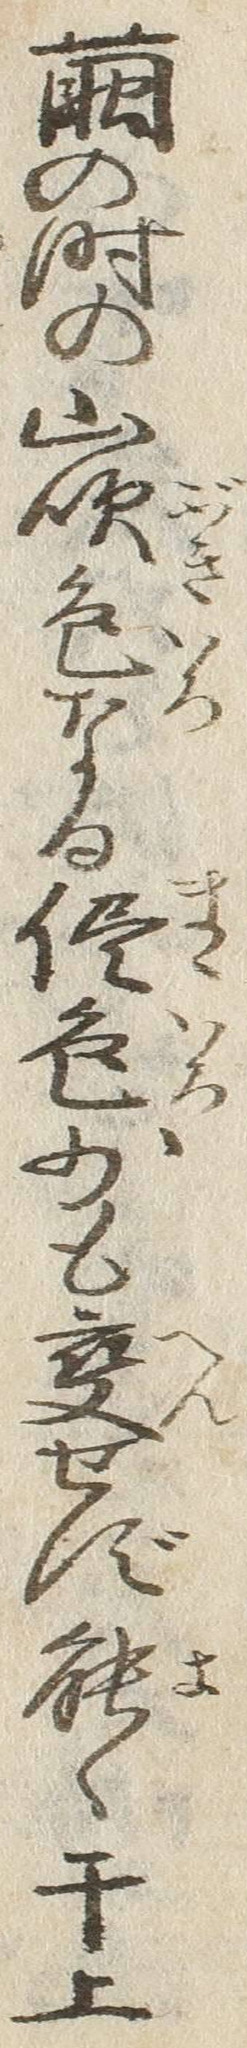繭の時の山吹色なる侭色少も變せず能く干上
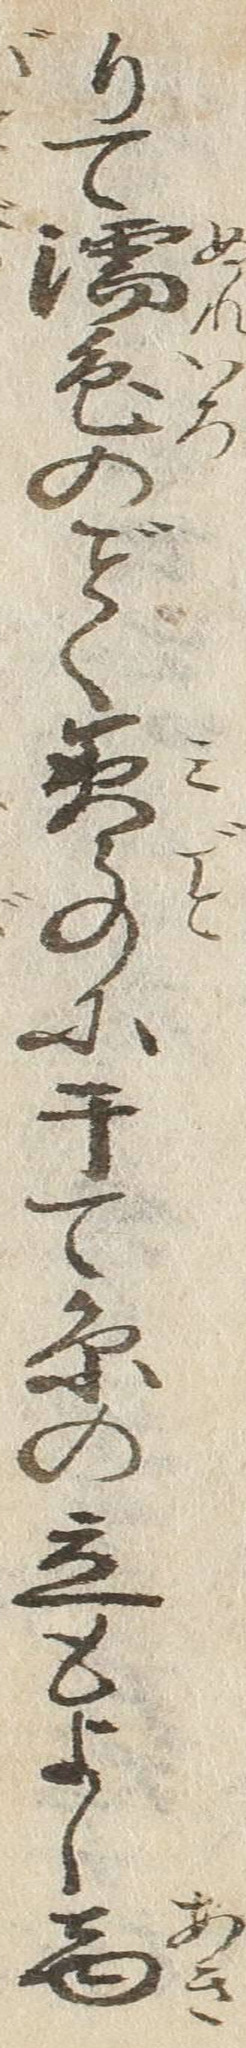りて濡色のごとく美事尓干て糸の立もよし商
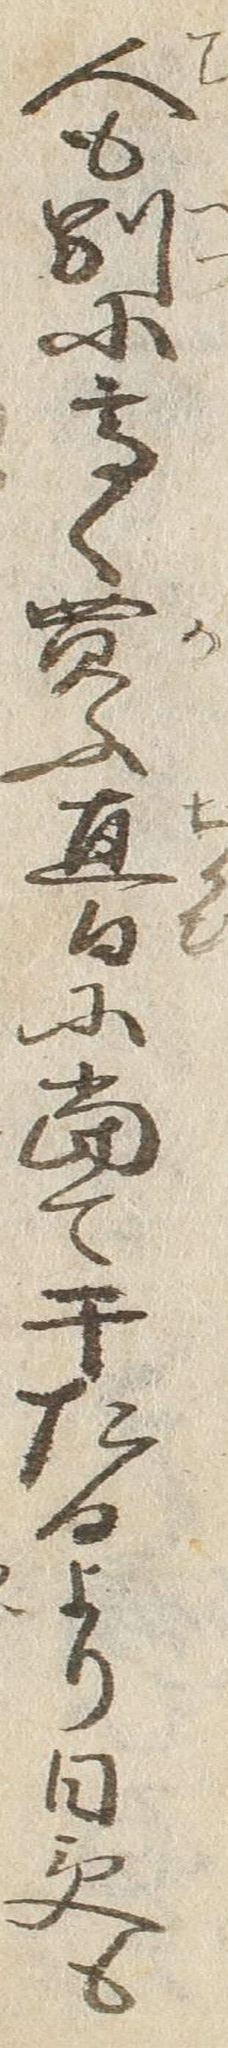人も別尓高く買ふ直日尓當て干たるより日受も
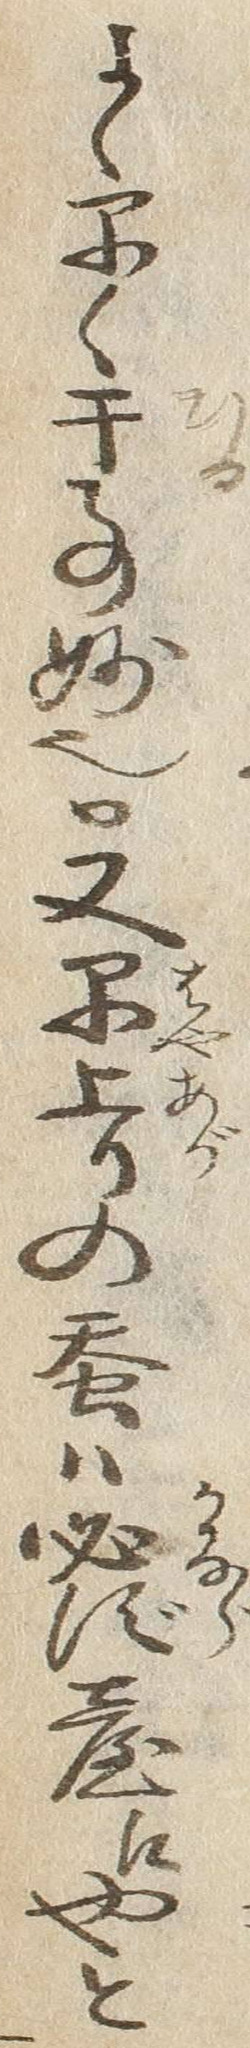よく早く干事妙也か又早上りの蚕は必ず臺江やと

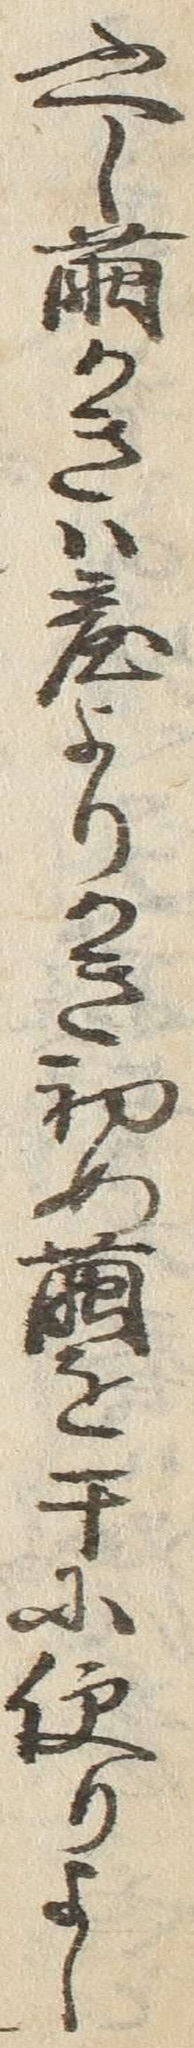ふへし繭かきは臺よりかき初め繭を干尓便りよし
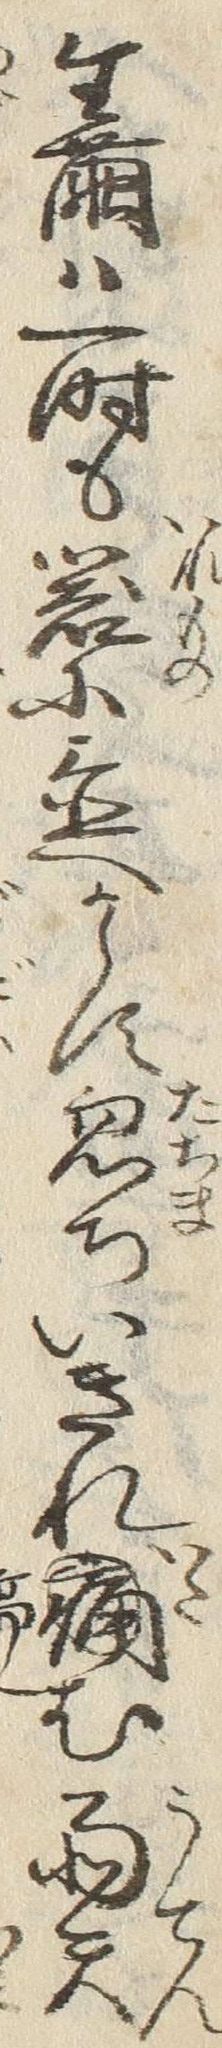生繭は一時も器尓置へから須忽ちいきれ傷む雨天
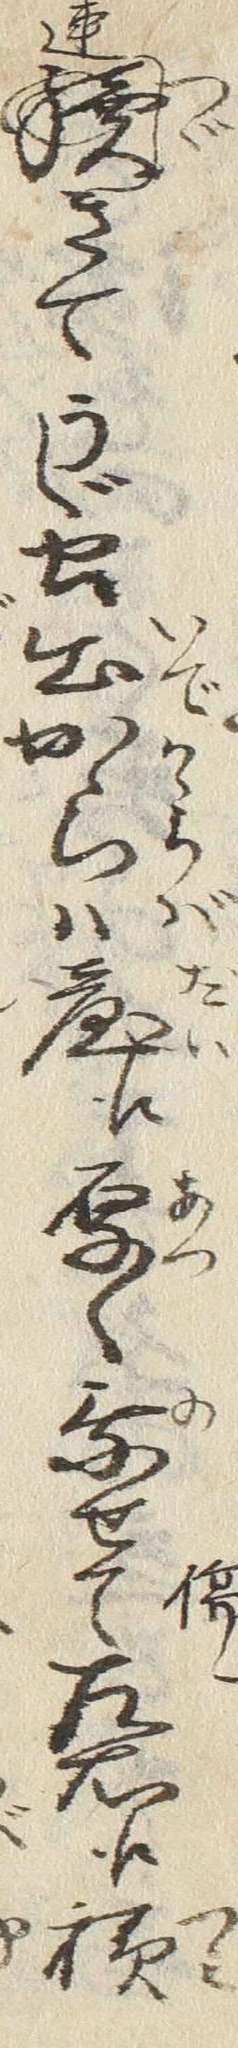連きてうじ虫出かゝらば臺江厚く乗せて左右江積
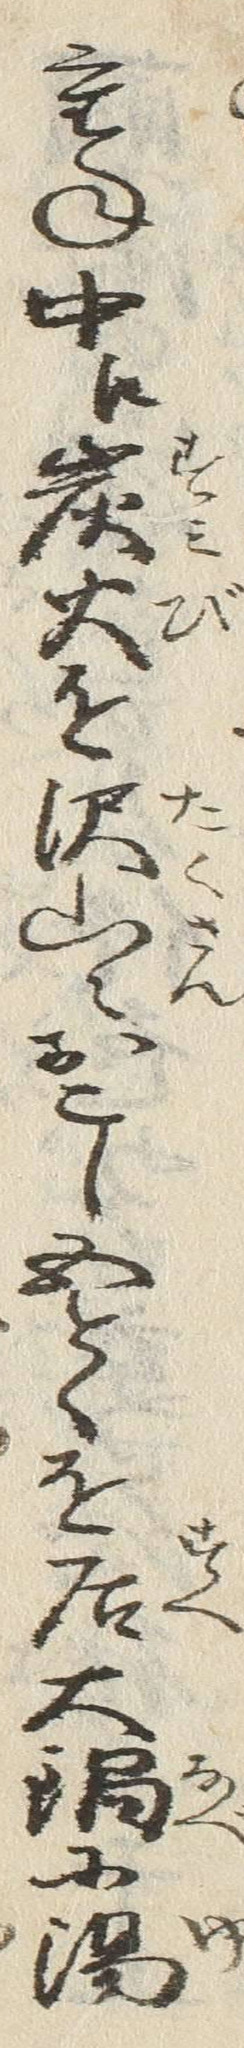重年中江炭火を沢山におこし五とくを居大鍋尓湯
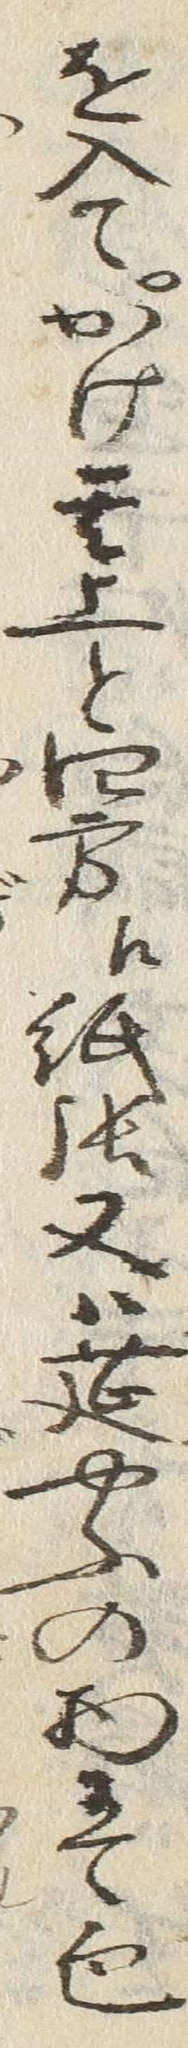を入て。かけ其上と四方江紙張又は筵やふの物尓て包
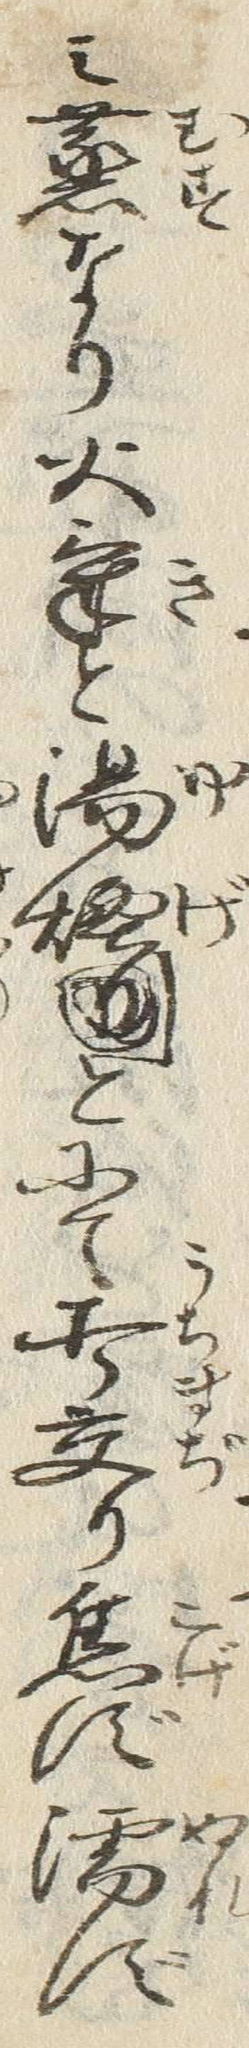み蒸なり火気と湯煙と尓て打交り焦ず濡ず
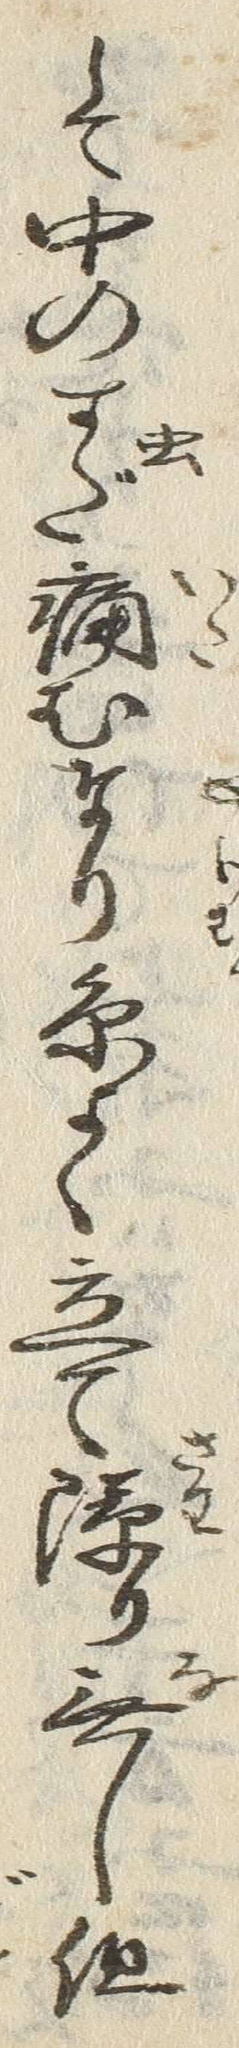して中のすだ痛むなり糸よく立て障り無し但
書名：養蠶實驗録後編
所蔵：東京大学農学生命科学図書館 国文学研究資料館
